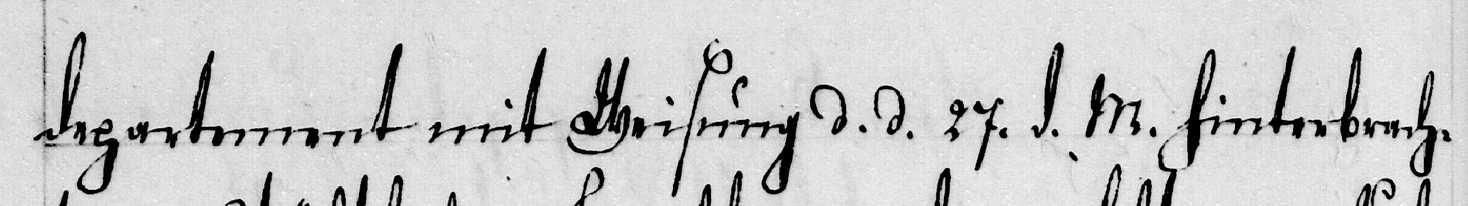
departement mit Weisung d. d. 27. d. M. hinterbrac¬
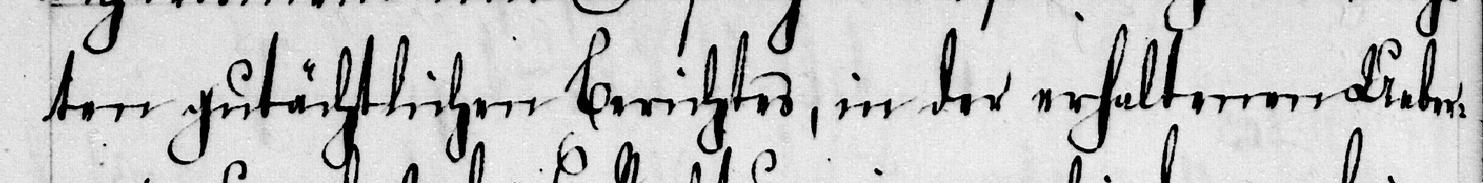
hten gutächtlichen Berichtes, in der erhaltenen Ueber¬
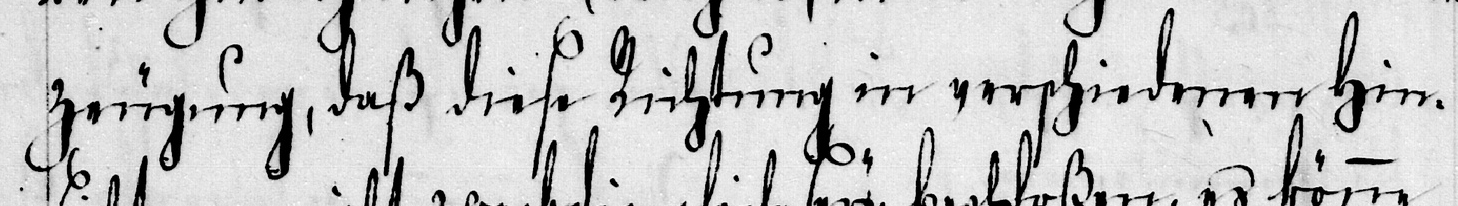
zeugung, daß diese Richtung in verschiedenen Hin¬
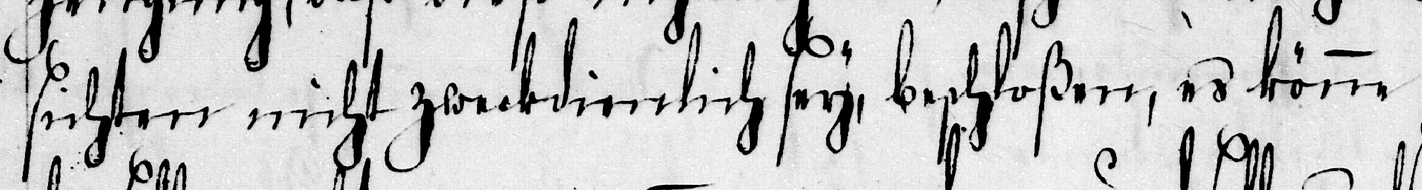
sichten nicht zweckdienlich sey, beschloßen, es könne
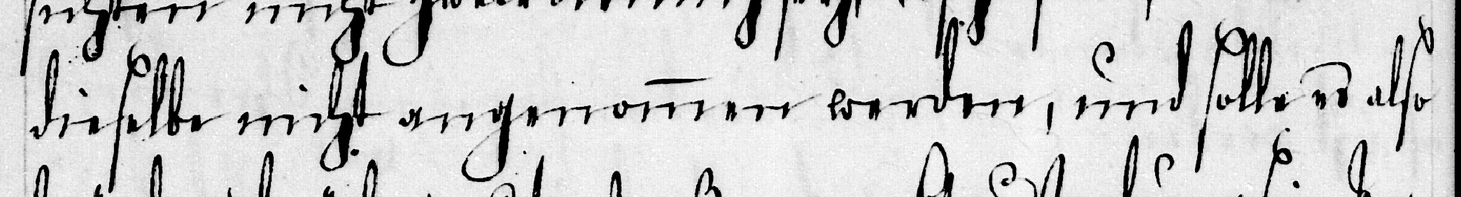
dieselbe nicht angenommen werden, und solle es also
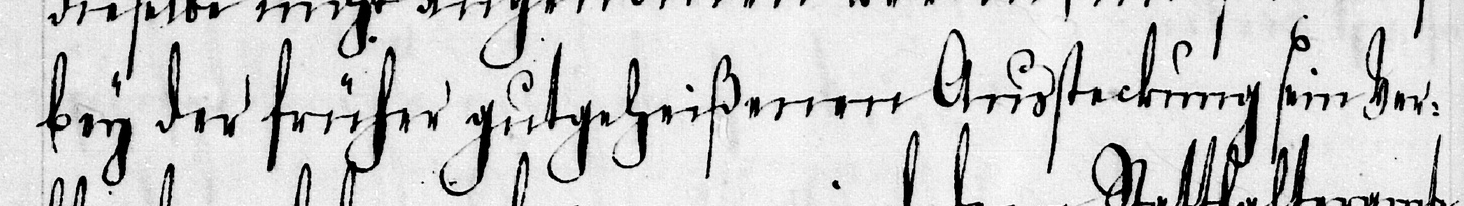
bey der früher gutgeheißenen Aussteckung sein Ver¬
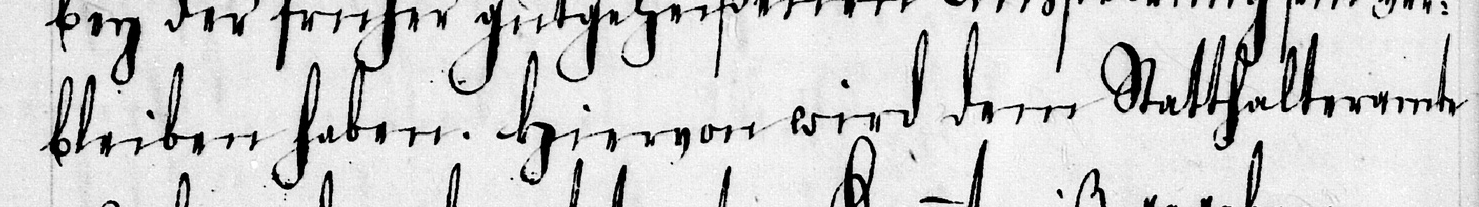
bleiben haben. Hiervon wird dem Statthalteramte
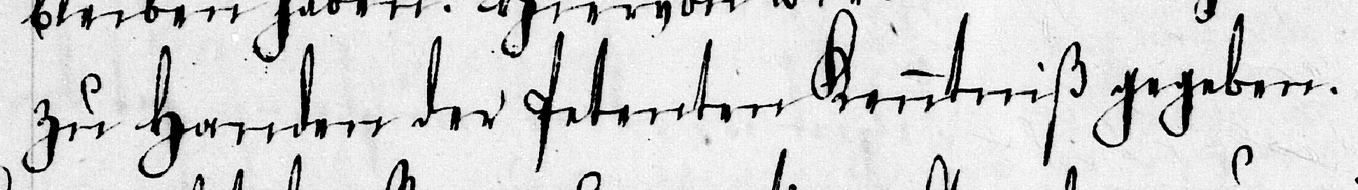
zu Handen der Petenten Kenntniß gegeben.
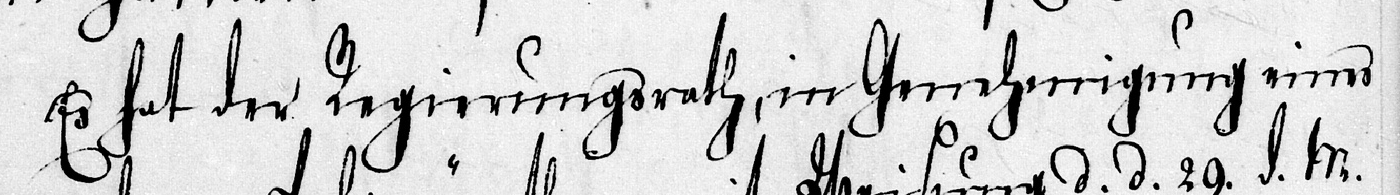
Es hat der Regierungsrath, in Genehmigung eines
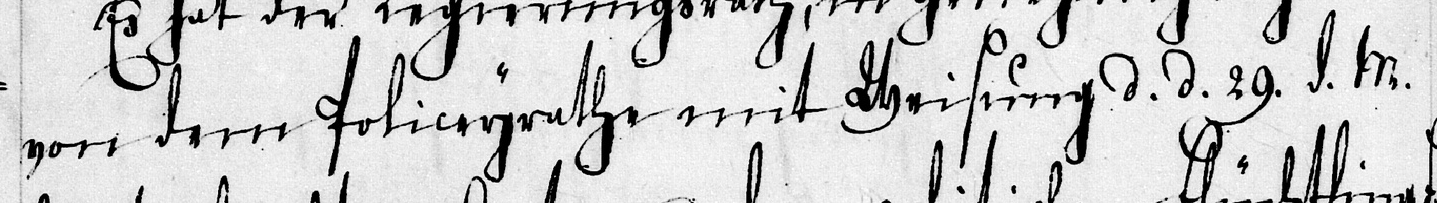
von dem Policeyrathe mit Weisung d. d. 29. d. M.
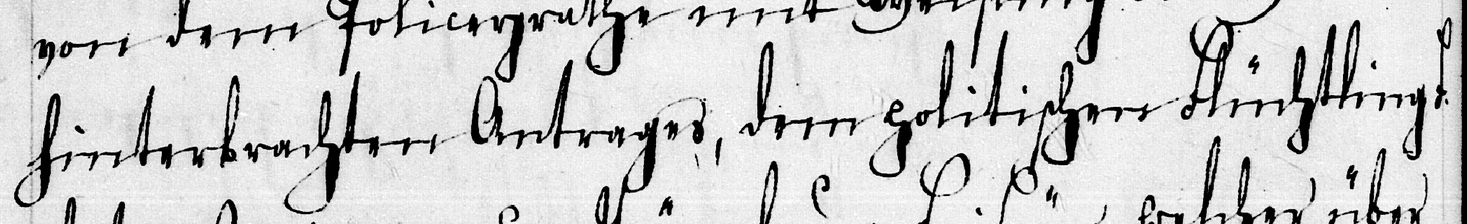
hinterbrachten Antrages, dem politischen Flüchtling
